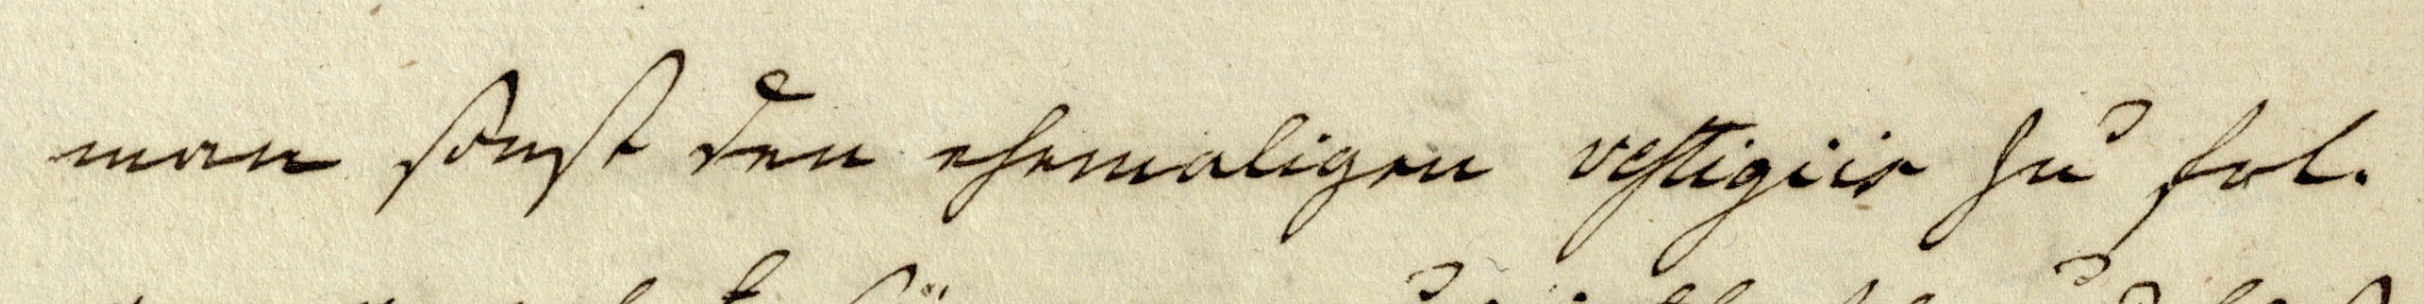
man sonst den ehemaligen vestigiis zu fol¬
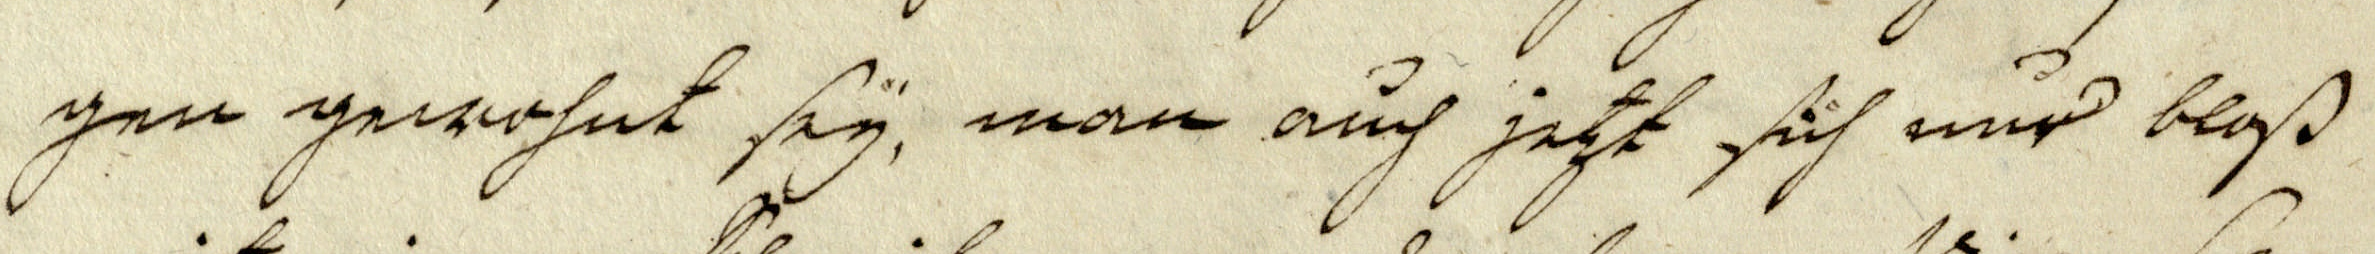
gen gewohnt seÿ, man auch jetzt sich nur bloß
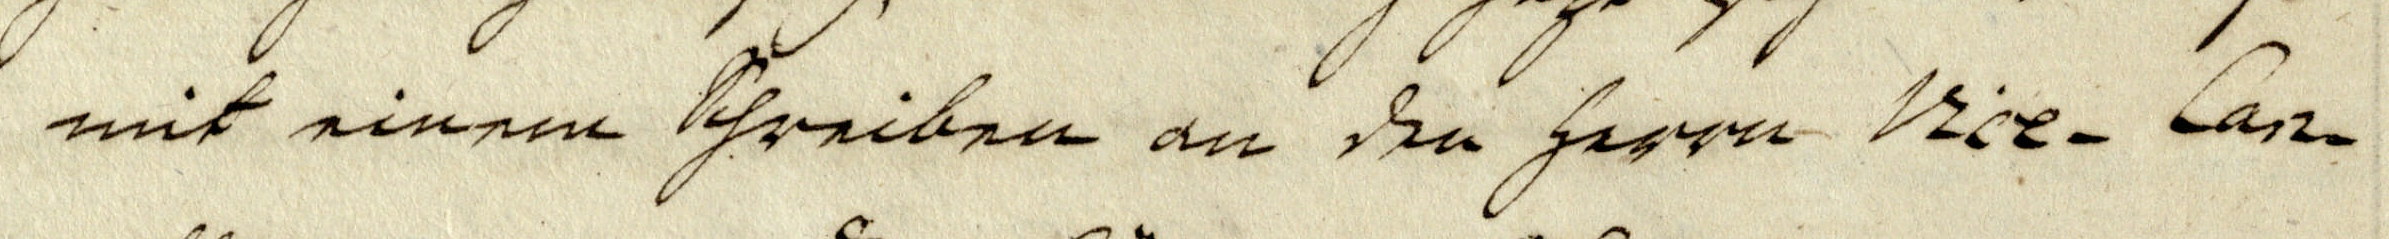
mit einem Schreiben an den Herrn Vice-Can¬
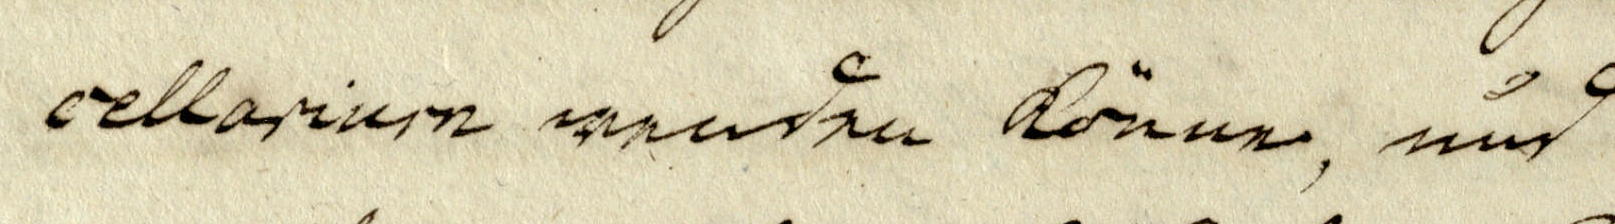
cellarium wenden könne, und
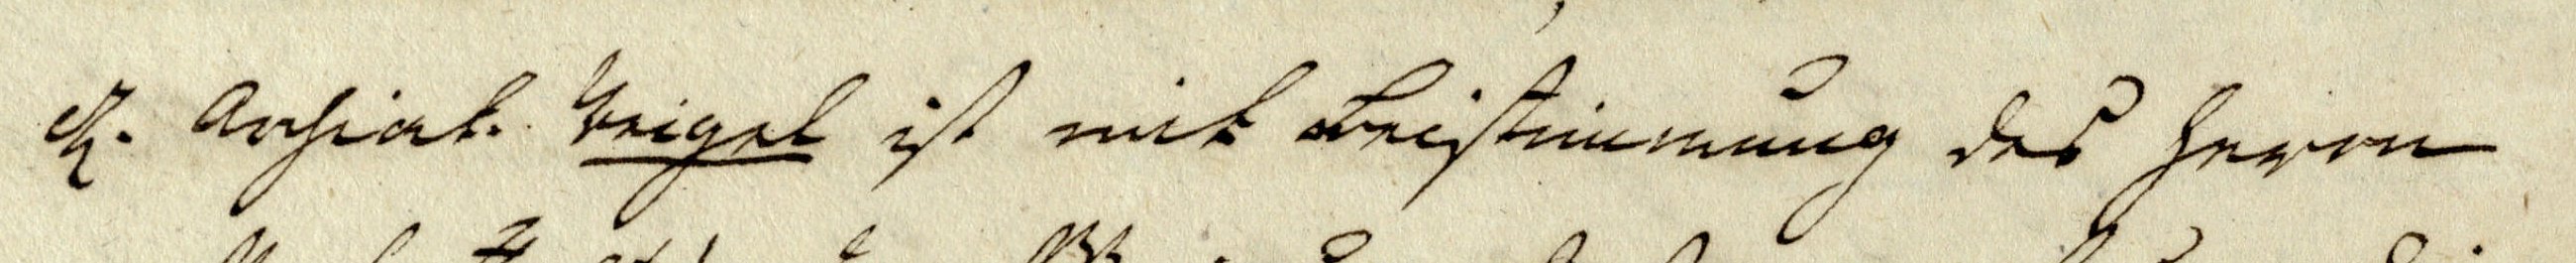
dh. Archiat. Weigel ist mit Beistimmung des Herrn
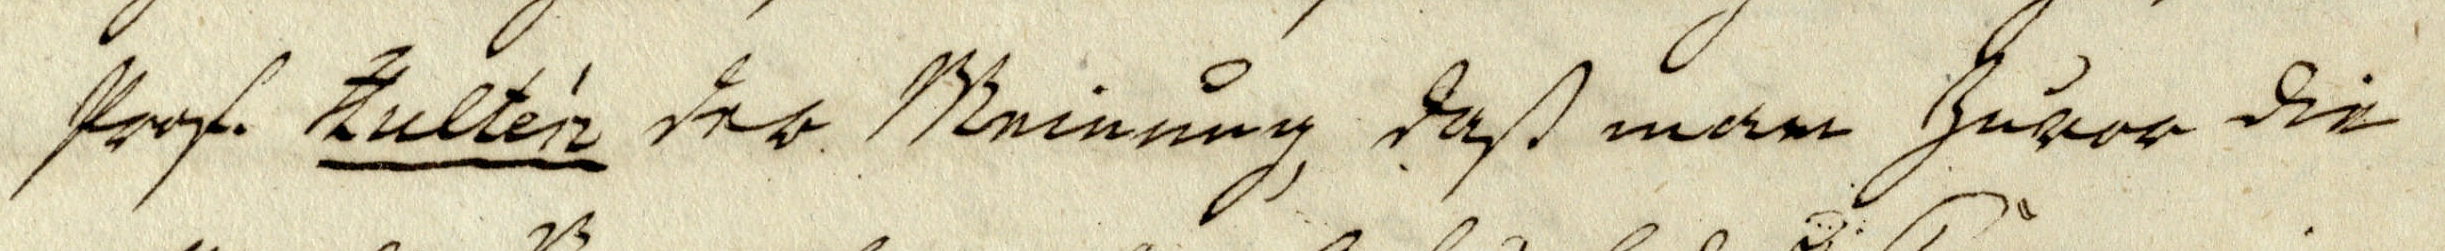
Prof. Hultén der Meinung, daß man zuvor die
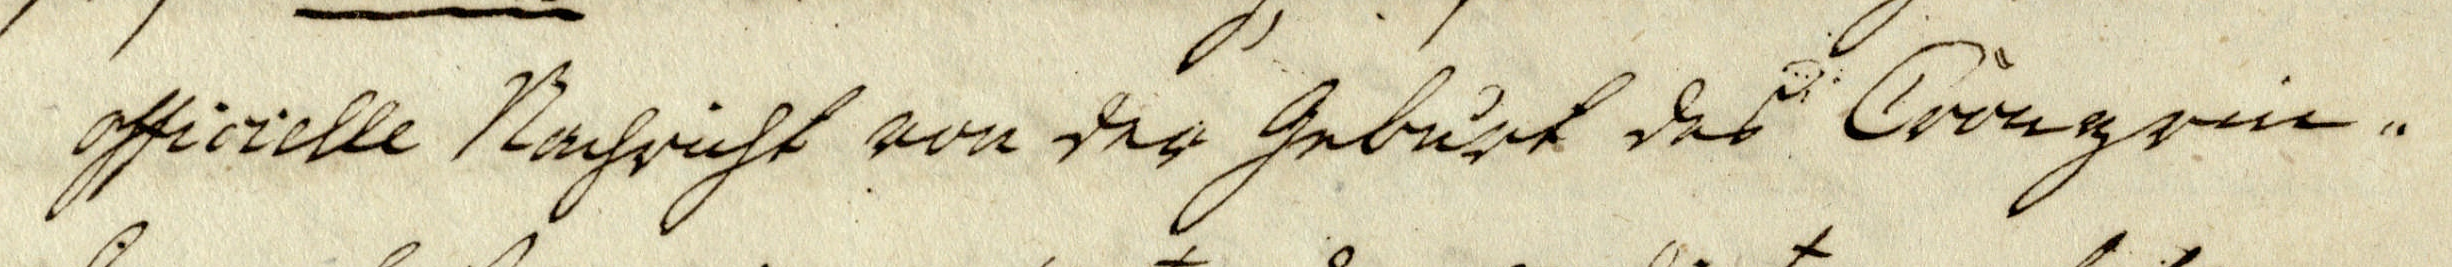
officielle Nachricht von der Geburt des Cronprin¬
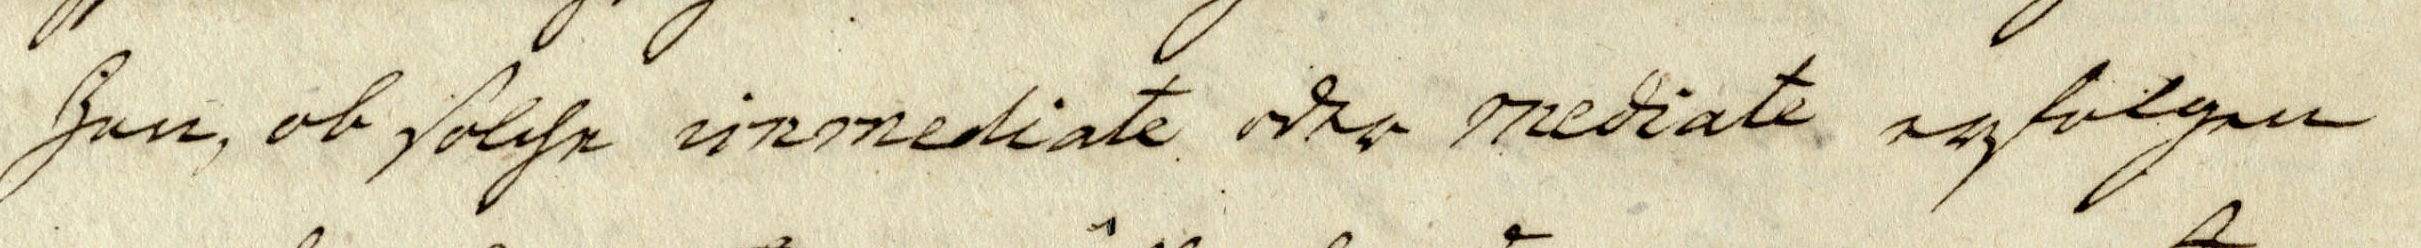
zen, ob solche immediate oder mediate erfolgen
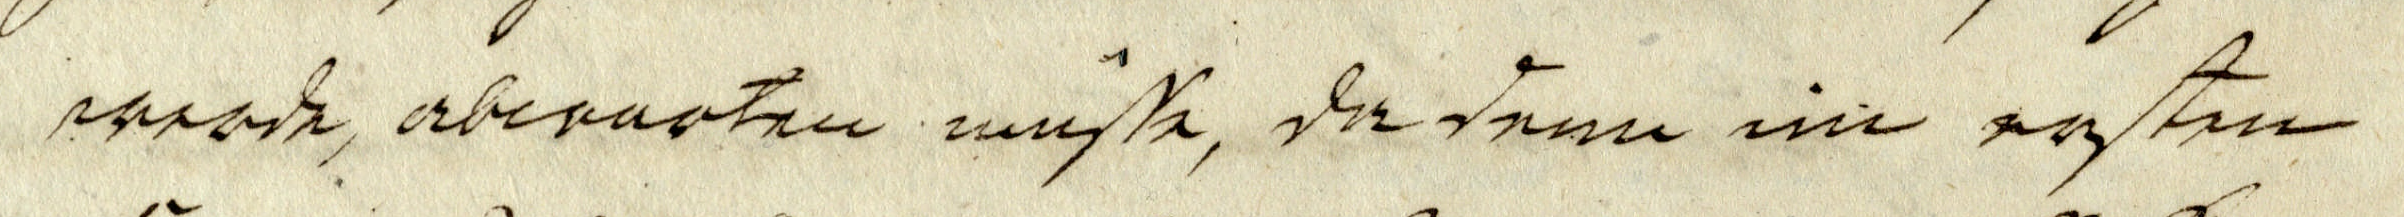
werde, abwarten müsse, da denn im ersten
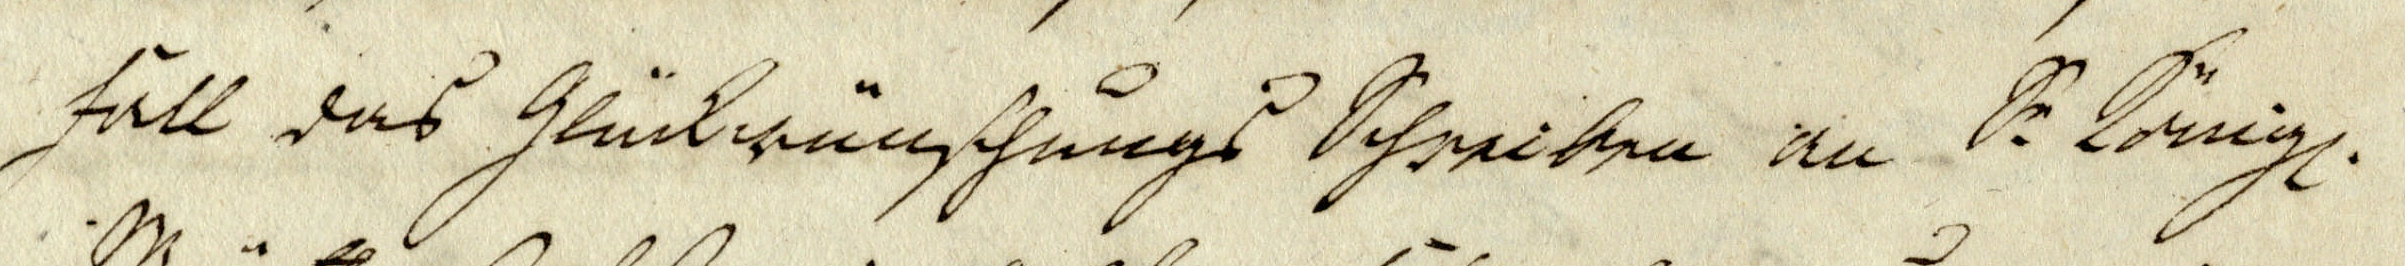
Fall das Glükwünschungs Schreiben an Sr Königl.
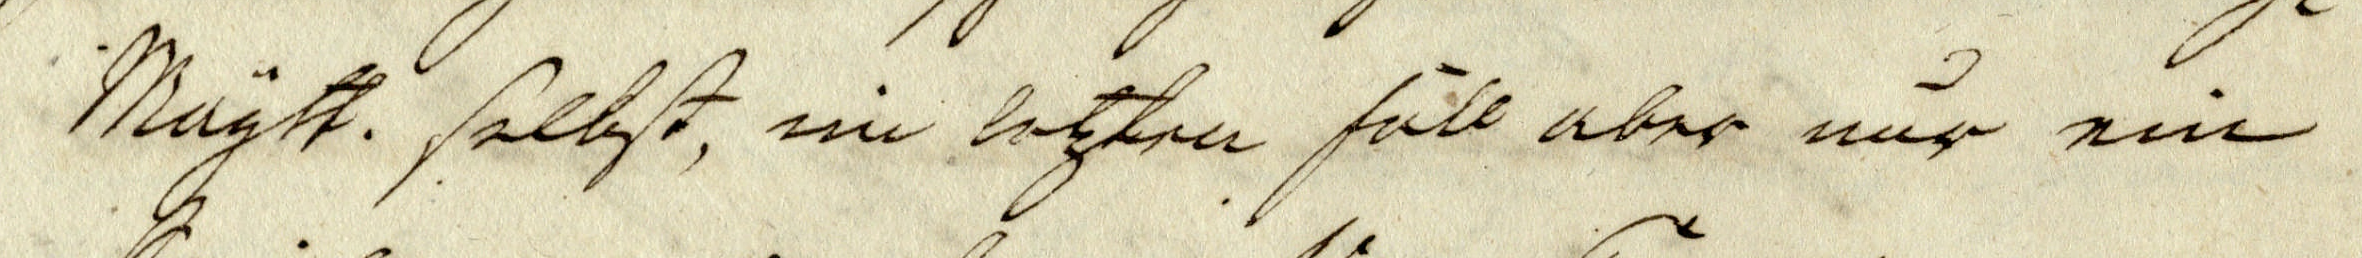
Maÿtt. selbst, im letzten Fall aber nur ein
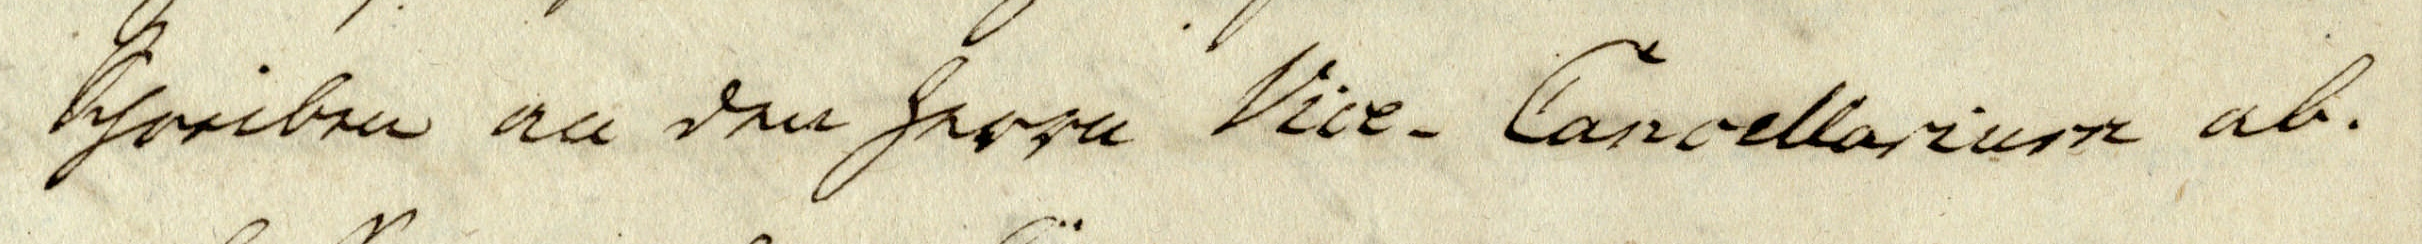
Schreiben an den Herrn Vice- Cancellarium ab¬
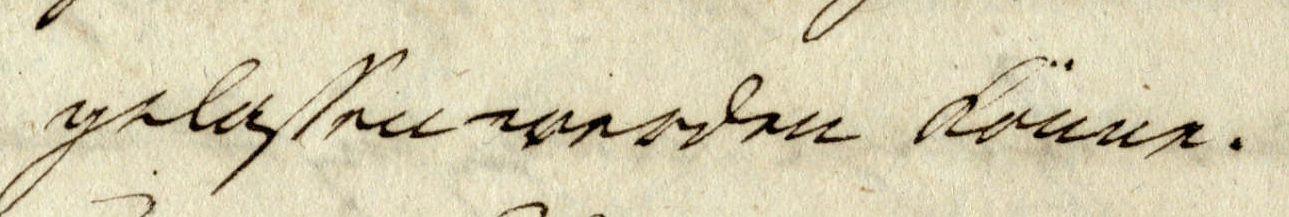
gelassen werden könne.
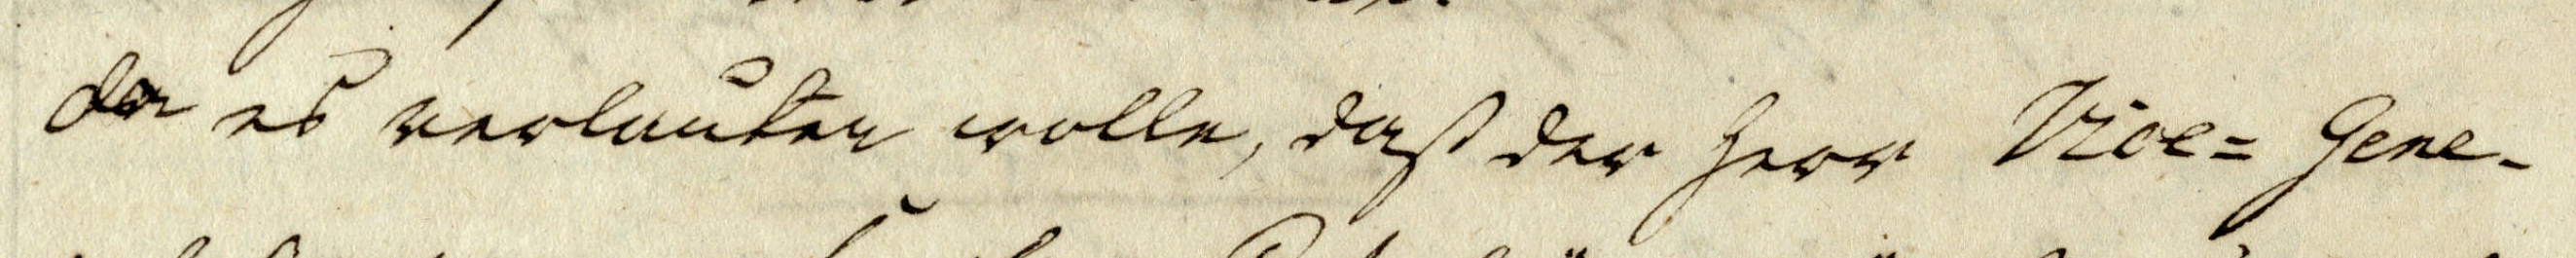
5., da es verlauten wolle, daß der Herr Vice Gene¬
